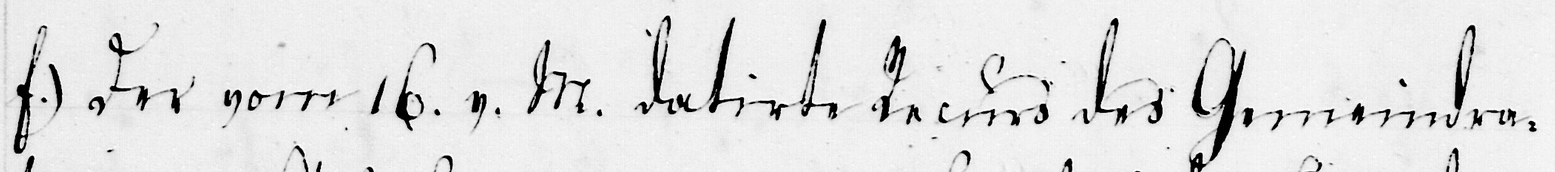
f.) Der vom 16. v. M. datirte Recurs des Gemeindra¬
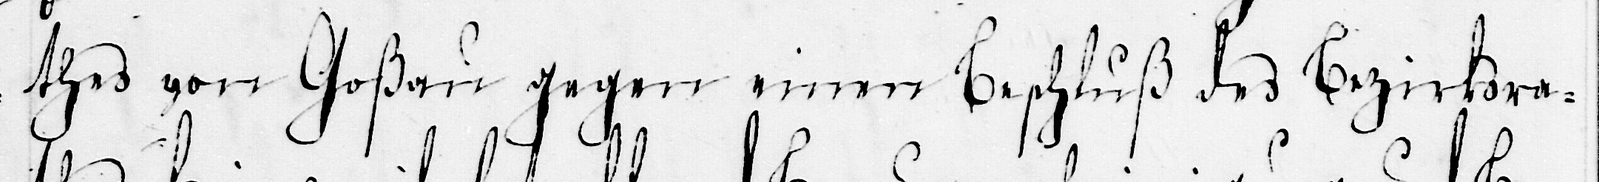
thes von Goßau gegen einen Beschluß des Bezirksra¬
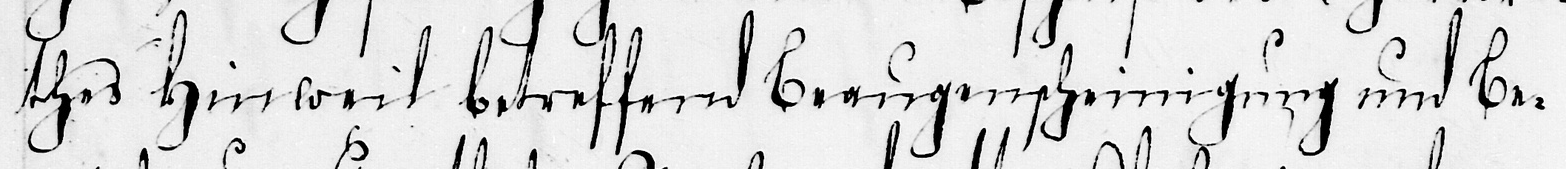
thes Hinweil betreffend Beaugenscheinigung und Be¬
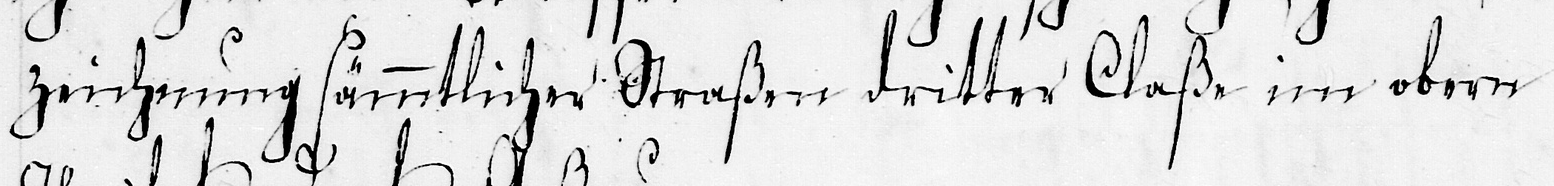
zeichnung sämmtlicher Straßen dritter Claße im obern
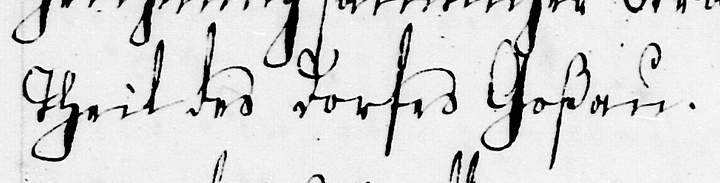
Theil des Dorfes Goßau.
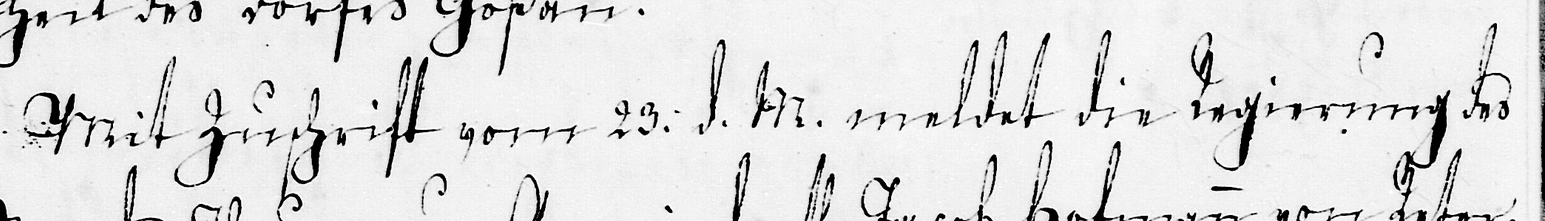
Mit Zuschrift vom 23. d. M. meldet die Regierung des
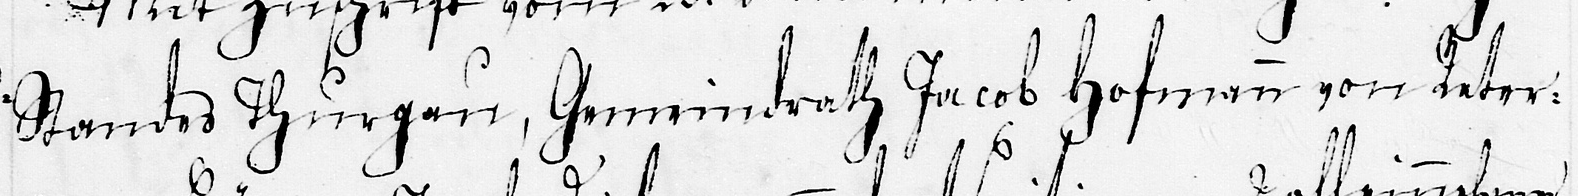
Standes Thurgau, Gemeindrath Jacob Hofmann von Reter¬
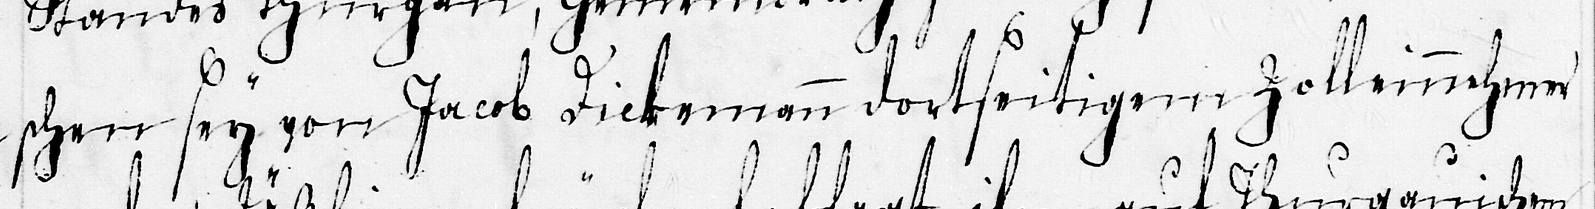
schen sey von Jacob Dickemann dortseitigem Zolleinnehmer
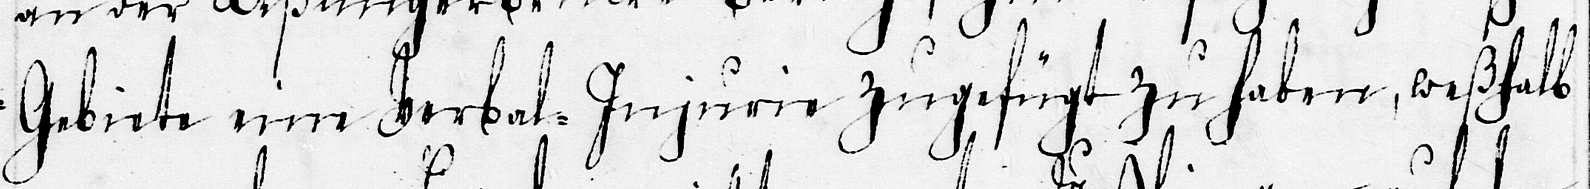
Gebiete eine Verbal-Injurie zugefügt zu haben, weßhalb
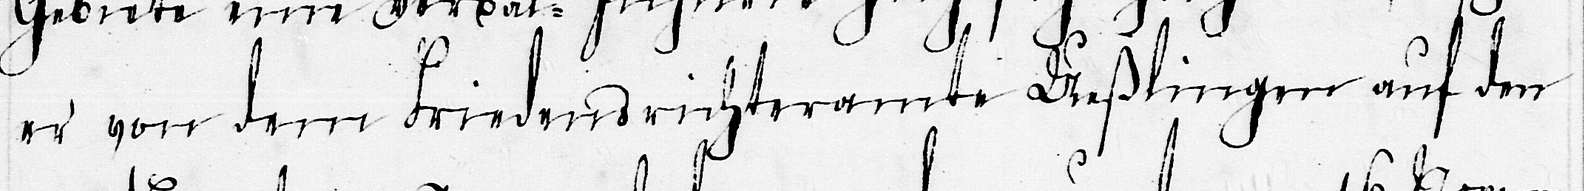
er von dem Friedensrichteramte Ueßlingen auf den
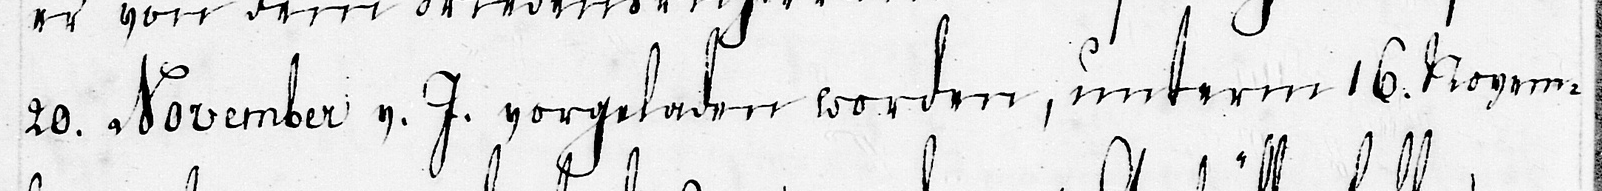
20. November v. J. vorgeladen worden, unterm 16. Novem¬
